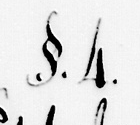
§. 4.
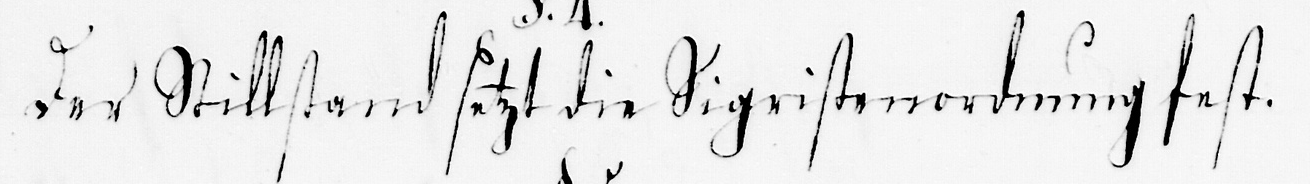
Der Stillstand setzt die Sigristenordnung fest.
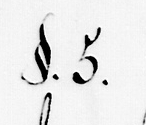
§. 5.
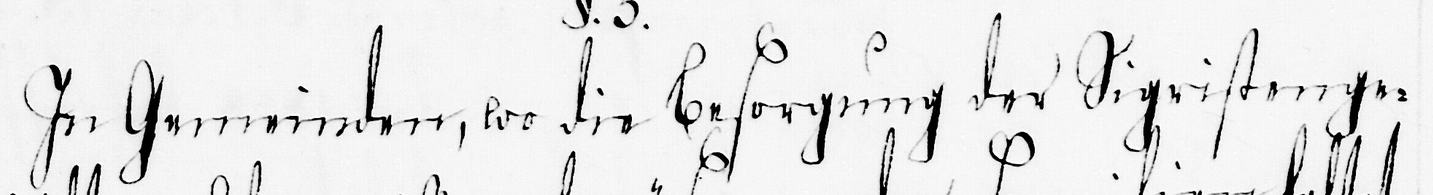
In Gemeinden, wo die Besorgung der Sigristenge¬
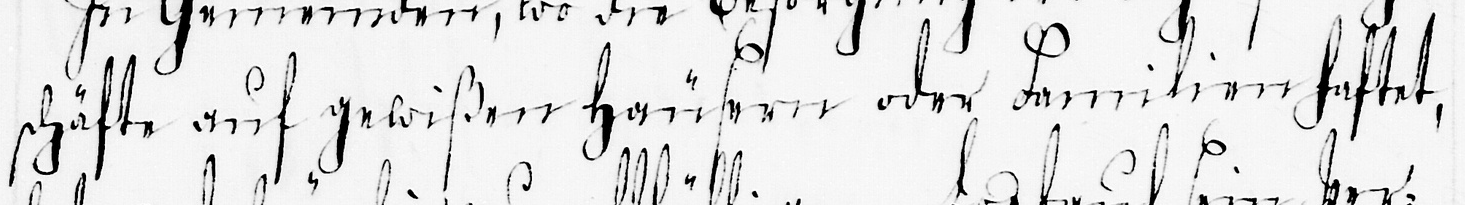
schäfte auf gewißen Häusern oder Familien haftet,
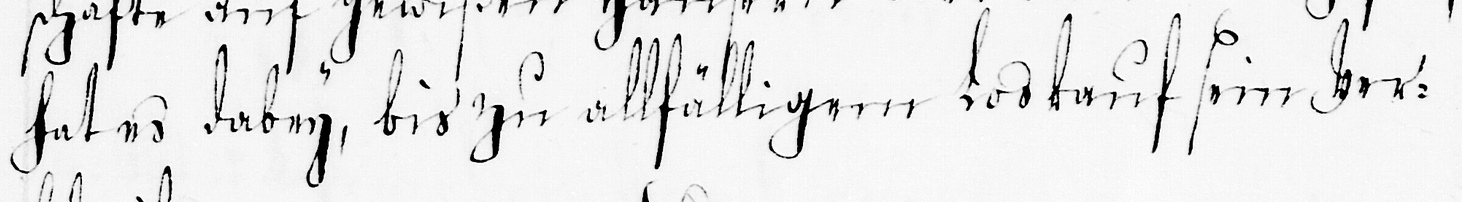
hat es dabey, bis zu allfälligem Loskauf sein Ver¬
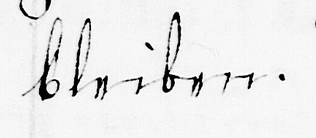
bleiben.
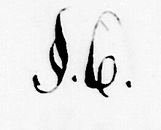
§. 6.
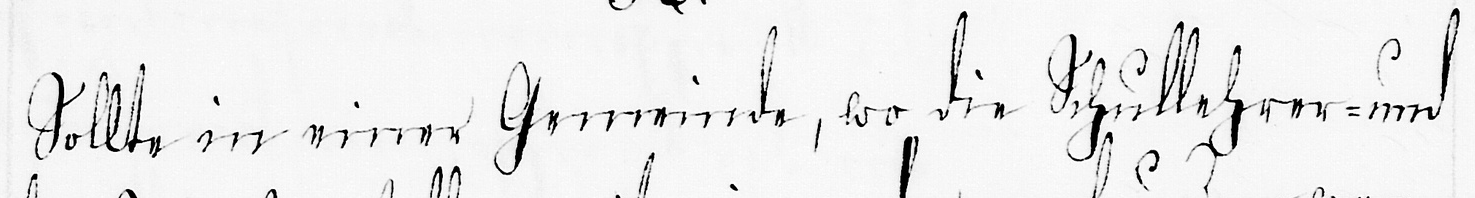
Sollte in einer Gemeinde, wo die Schullehrer- und
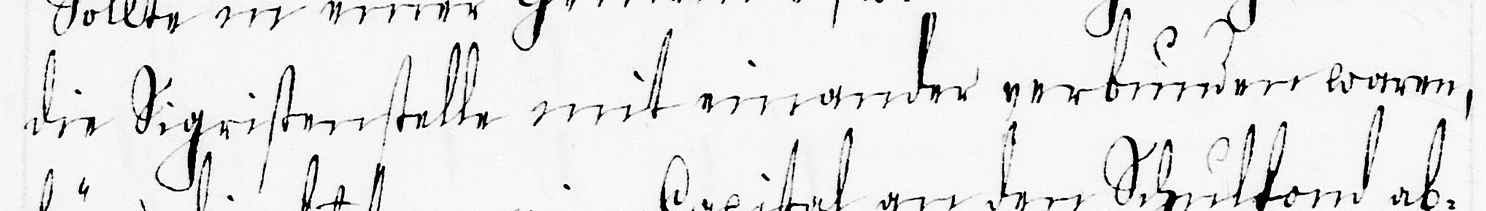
die Sigristenstelle mit einander verbunden waren,
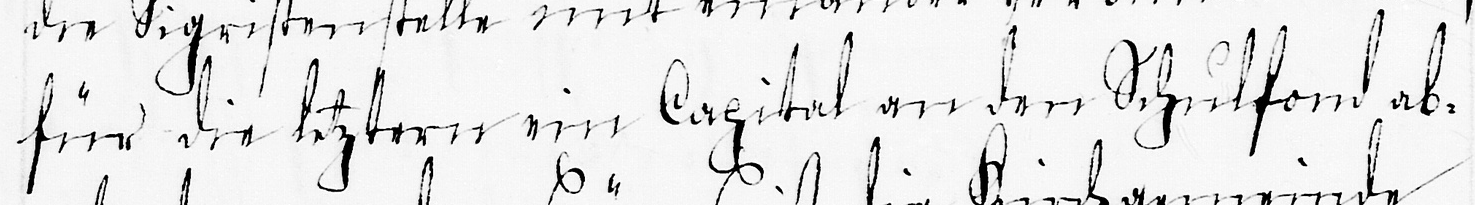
für die Letztern ein Capital an den Schulfond ab¬
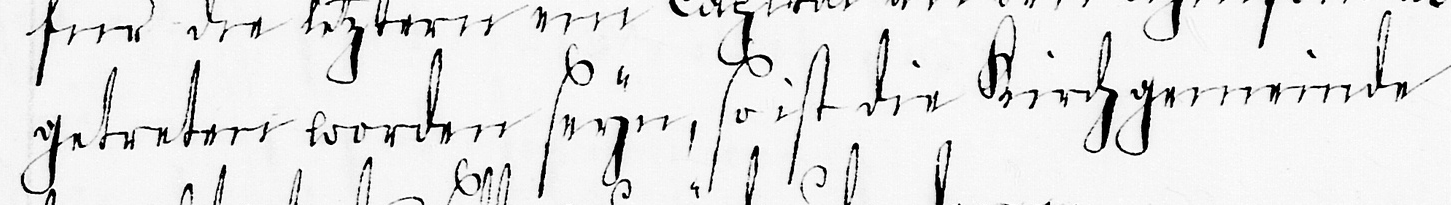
getreten worden seyn, so ist die Kirchgemeinde
